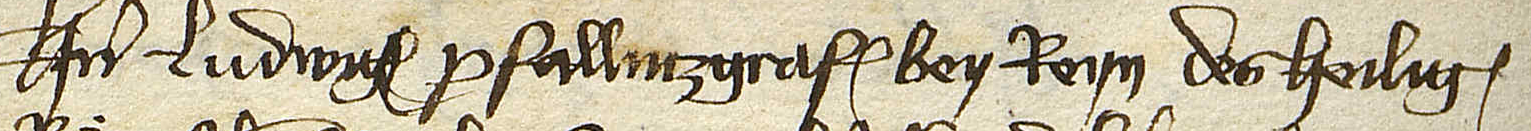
Hn* Ludwig* Pfallncʒgraf* bey Reyn des heilig*
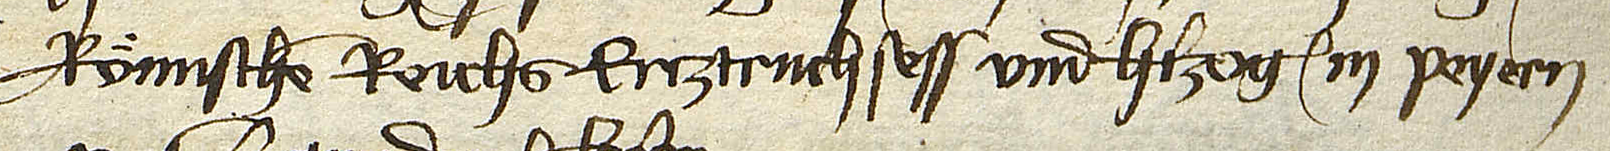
Römiſche* Reichs Ercʒtruchſeſſ vnd h*cʒog* in peyern
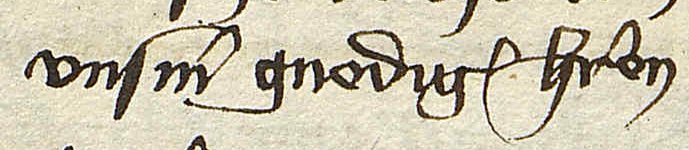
vnſ*m gnedig* hr*en
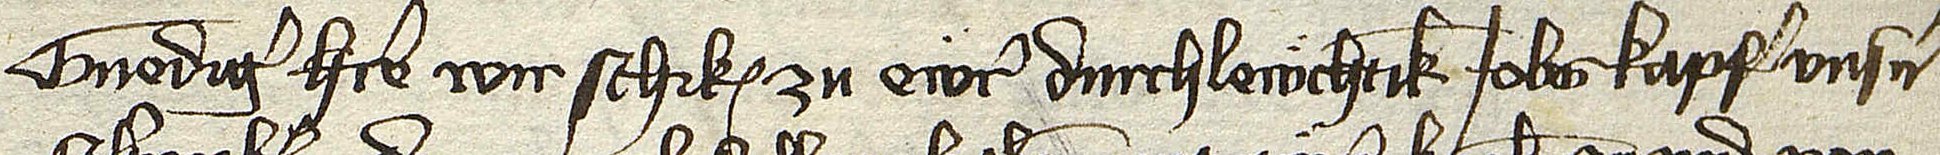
Gnedig* hre* wir ſchik* ʒu eẅr* durchleẅchtik* Iobs Kapf* vnſ*n
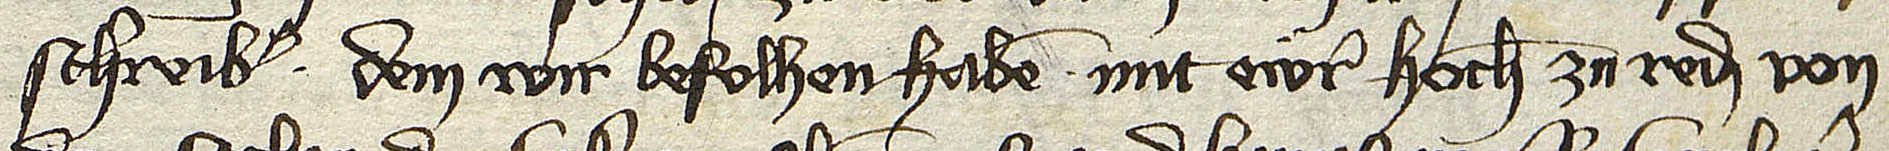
ſchreib* . dem wir befolhen habe* . mit eẅr* hoch* ʒu red* von
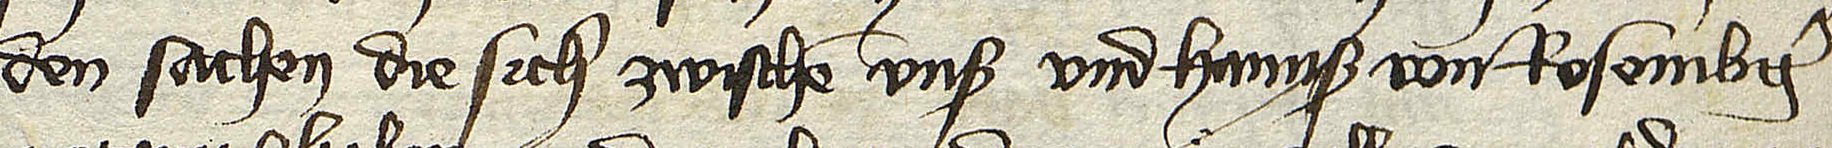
den ſachen die ſich ʒwiſche* vnſ* vnd hannſ* von Roſembg*
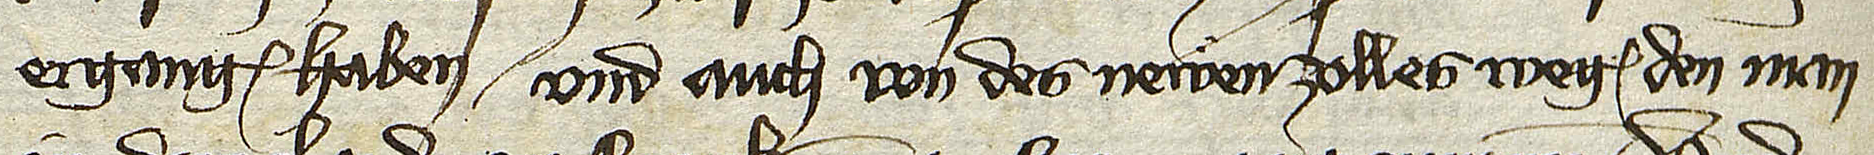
ergang* haben / vnd auch von des neẅen ʒolles weg* den man
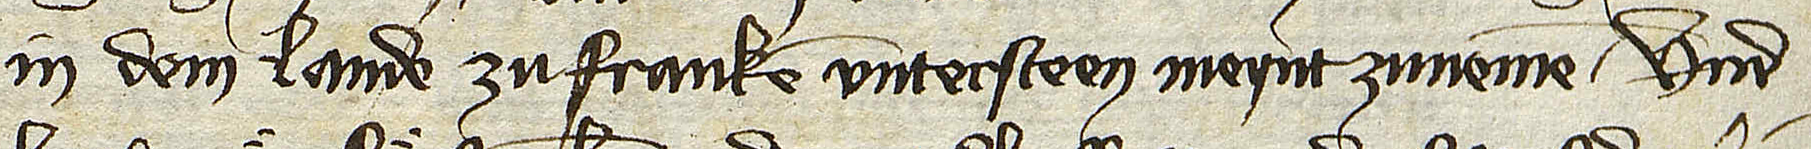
in dem lande ʒu franke* vnterſteen meynt ʒuneme* / Vnd
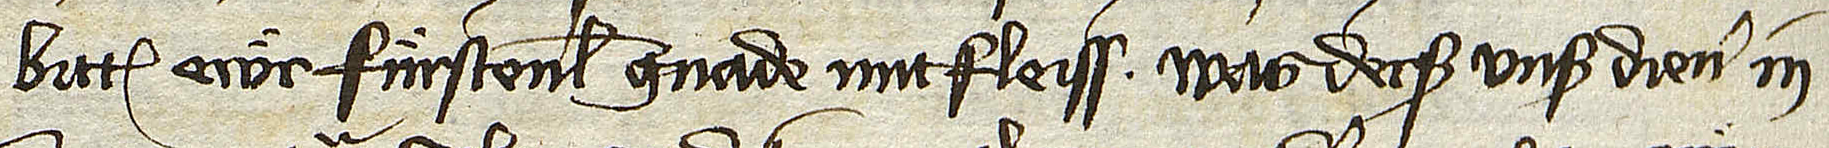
bitt* eẅr fürſtenl* gnade mit fleiſſ . was derſ* vnſ* dien* in
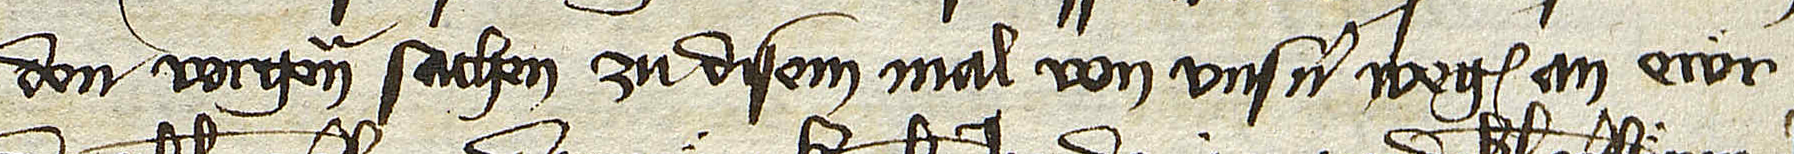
den vorgen* ſachen ʒu diſem mal von vnſ*n weg* an eẅr
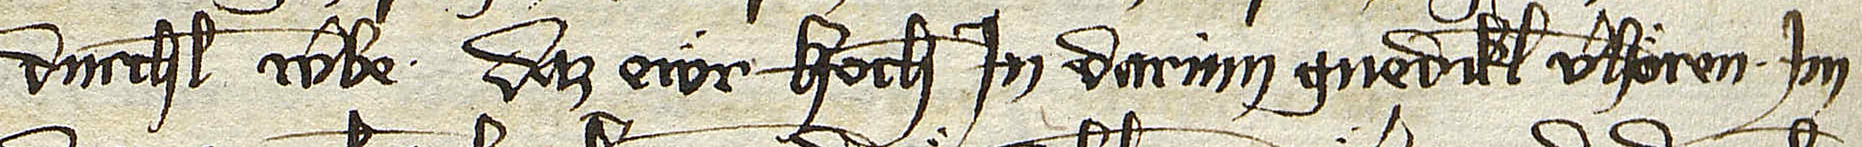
durchl* w*be . Daʒ eẅr Hoch* In darinn gnedikl* v*hören . Im
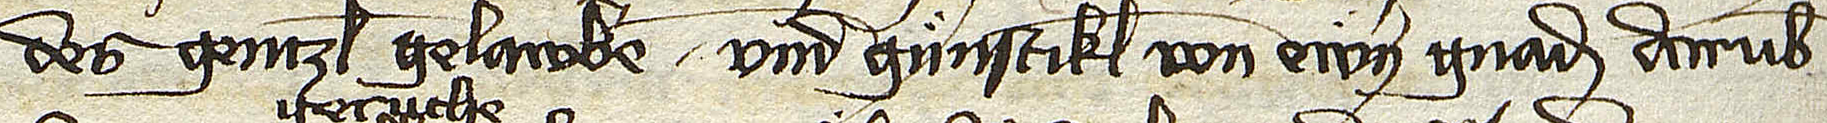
des gencʒl* gelawbe* / vnd günſtikl* von eẅ*n gnad* darub*
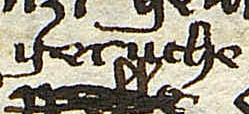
geruche
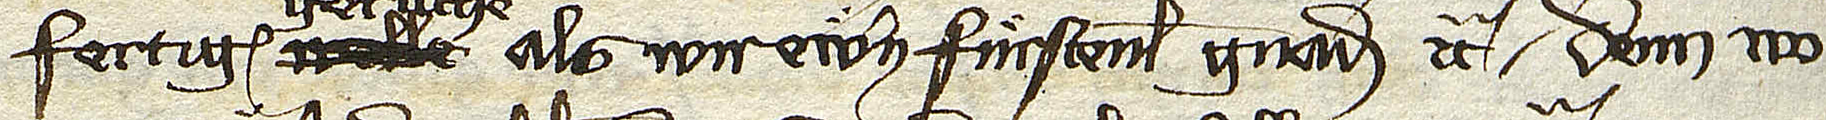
fertig* welle als wir eẅ*n fürſtenl* gnad* ec* / Denn wo
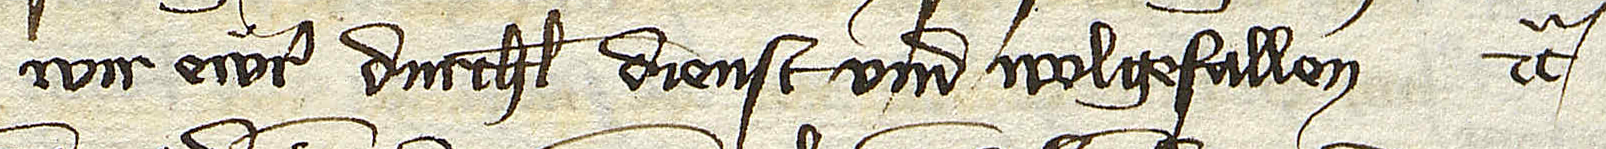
wir eẅ*r durchl* dienſt vnd wolgefallen ec* /
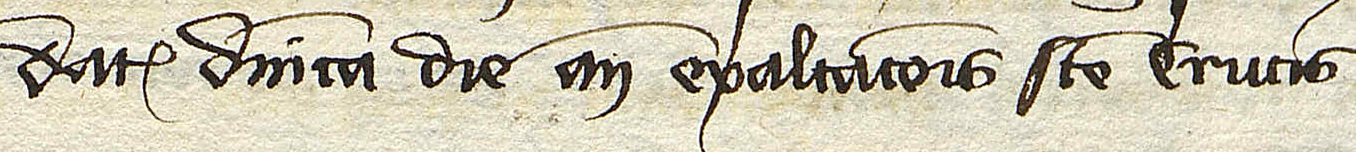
Dat* dnica* die an* exaltacois ſce* Crucis
